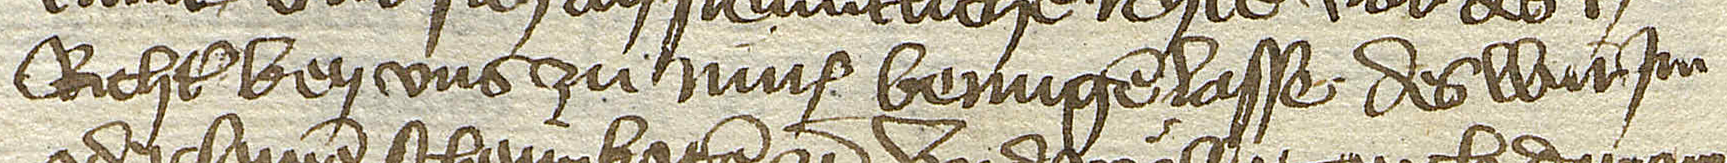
Richt* bey vns cʒu Nür* benuge* laſſe des wir Im
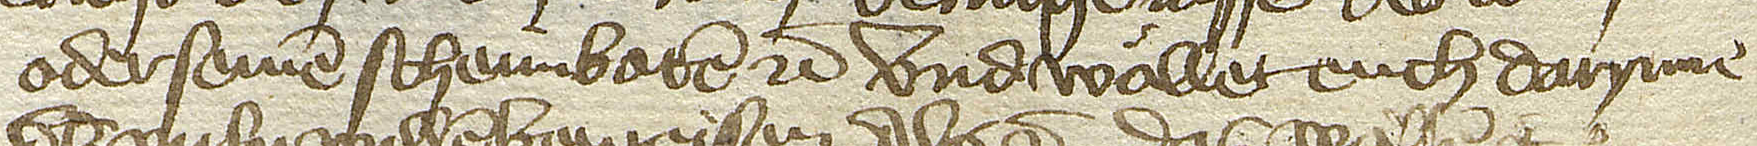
oder ſeine* ſcheinbote* ec* vnd wöllet euch darynne
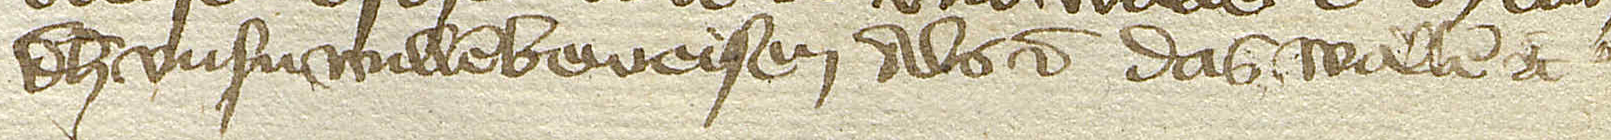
d*h vnſ*n wille* beweiſen Als ec* das wölle* ec*
